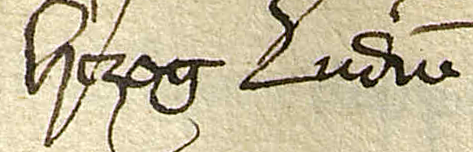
h*cʒog Ludw*
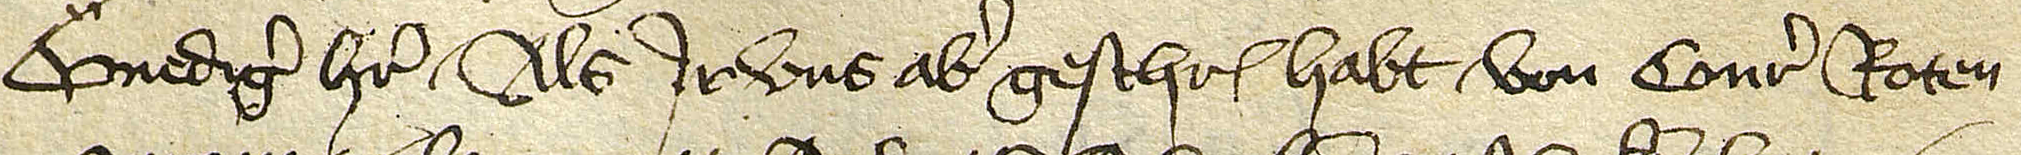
Gnedig* hr* / Als Ir vns ab* geſchr* habt / von Conr* Roten
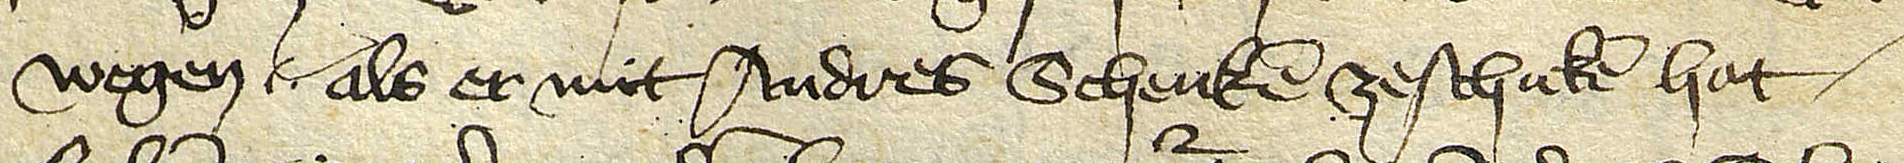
wegen / . als er mit Andres Schenke* cʒeſchicke* hat /
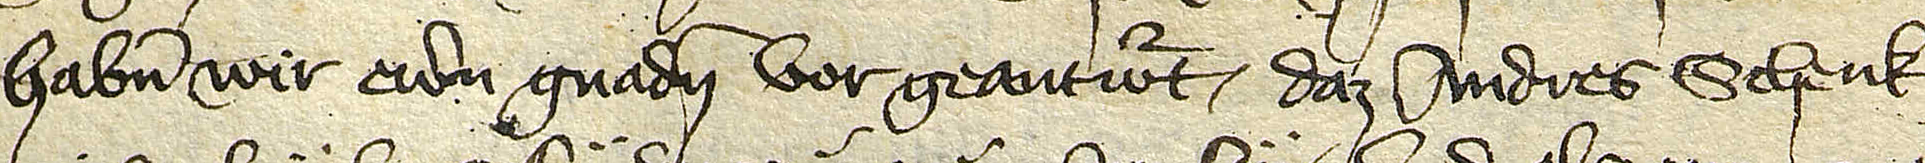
habn* wir ew*n gnadn* vor geantw*t / daʒ Andres Schenk
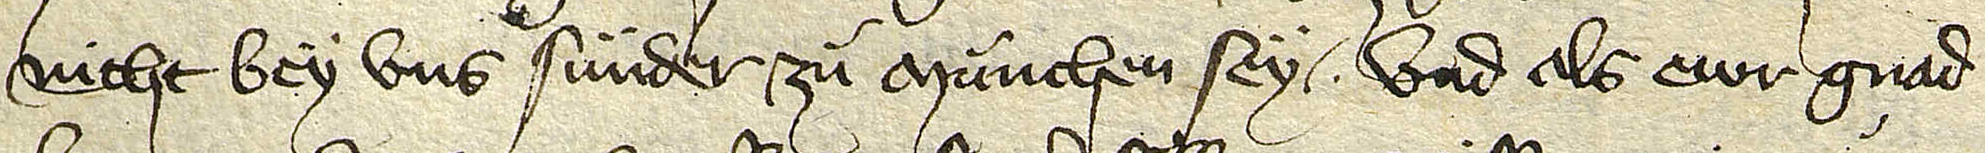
nicht bey vns ſünder cʒu München ſey / . vnd als ewr gnad
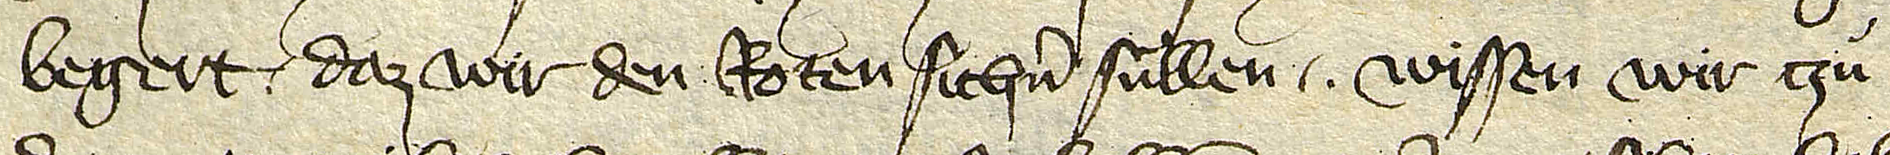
begert / daʒ wir den Roten ſichn* ſüllen / . wiſſen wir cʒü
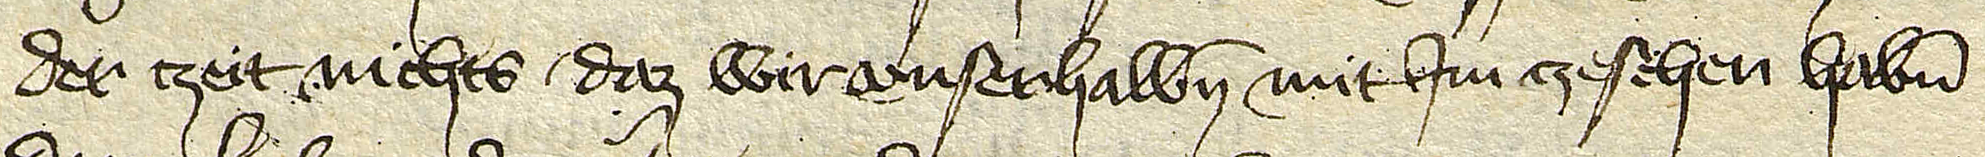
der cʒeit nichts / daʒ wir vnſerhalbn* mit Im cʒeſehen habn*
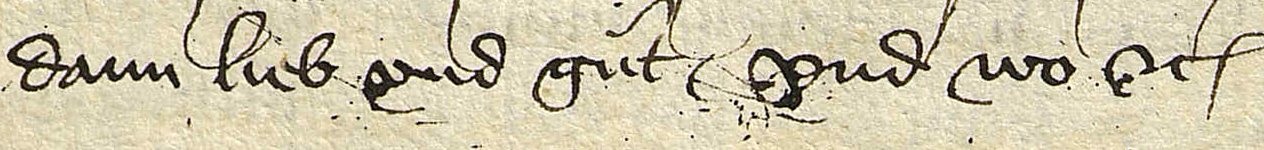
dann lieb vnd gut / vnd wo ec*
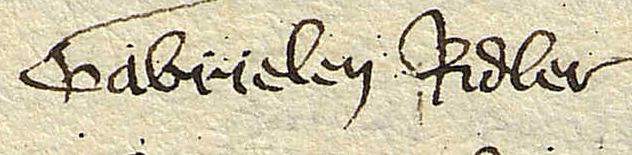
Gabrielen Ridler
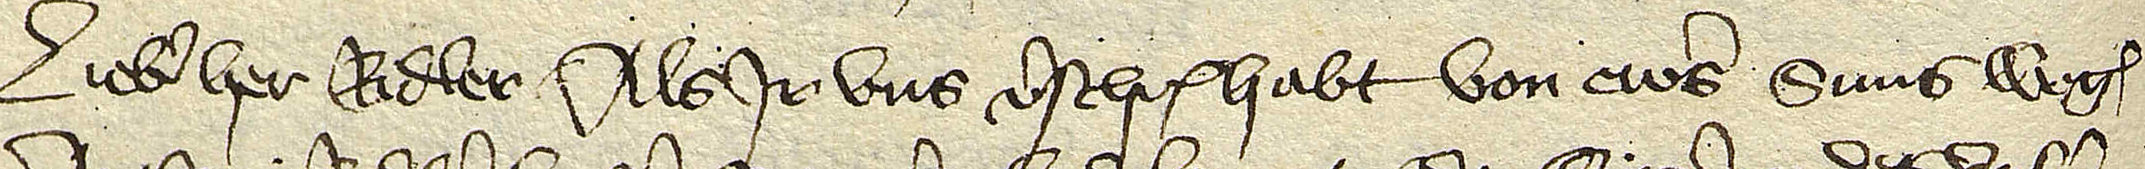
Lieb* her Ridler / Als Ir vns v*ſchr* habt von ews* Suns weg*
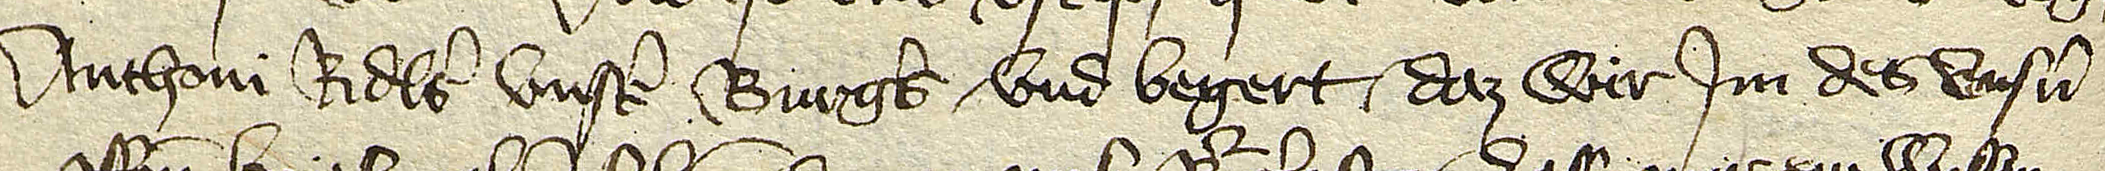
Anthoni Ridls* vnſ*s Burg*s / vnd begert / daʒ wir Im des vnſn*
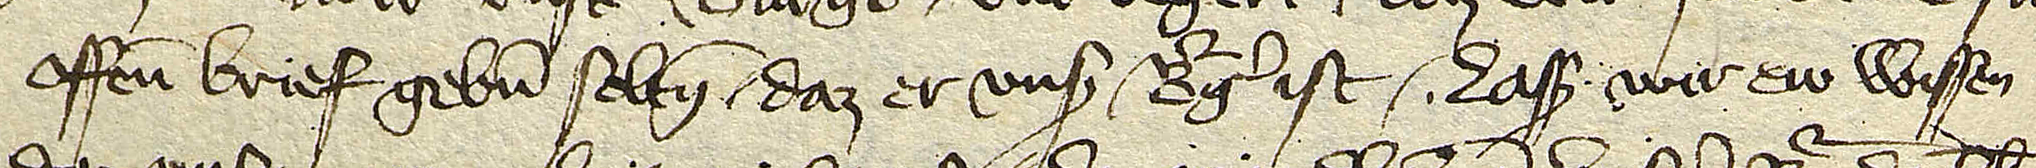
offen* brief gebn* ſoltn* / daʒ er vnſ* B*g* iſt / . Laſſ* wir ew wiſſen
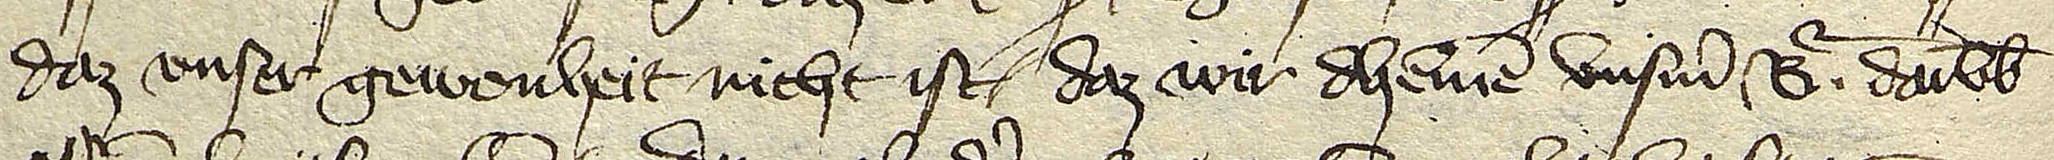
daʒ vnſer gewonheit nicht iſt / daʒ wir dheine* vnſm* B* . darvb*
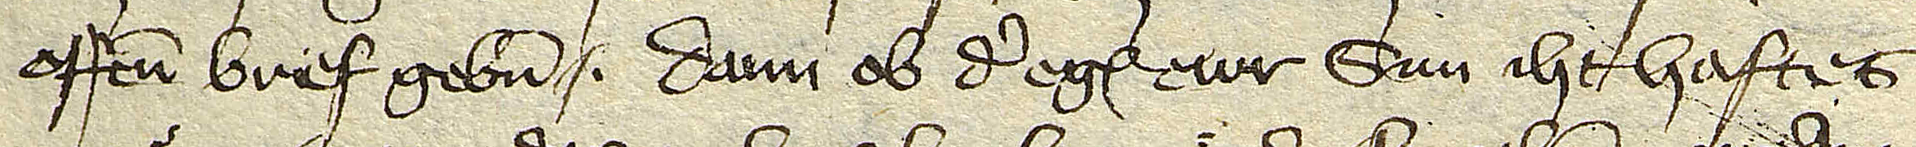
offen* brief gebn* / . dann ob d* eg* ewr Sun iht haftes
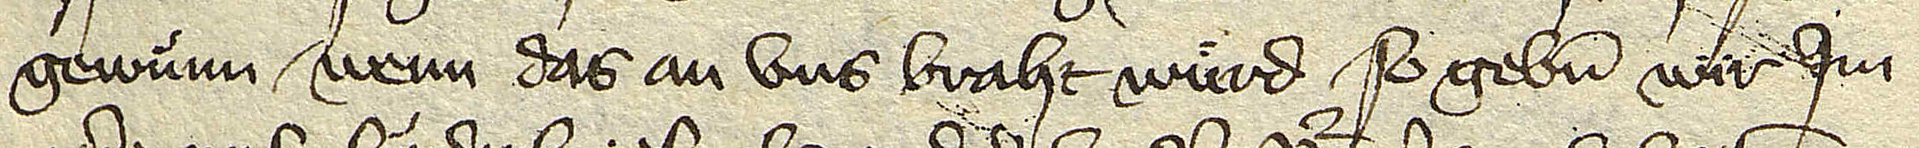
gewünn / wenn das an vns braht würd / ſo gebn* wir Im
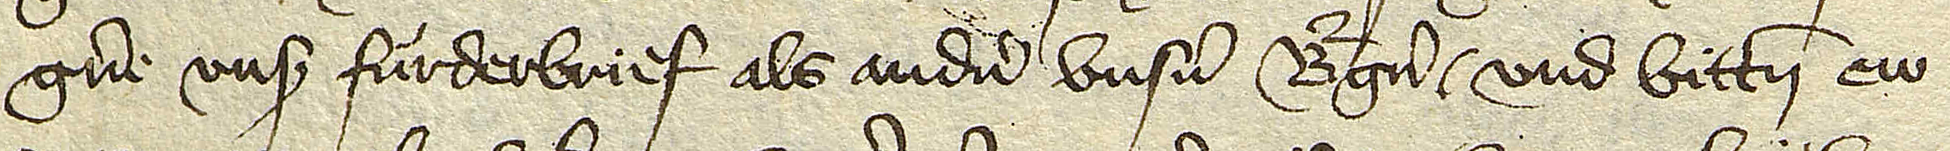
gn*e vnſ* fürderbrief als andn* vnſn* B*gn* / vnd bittn* ew
